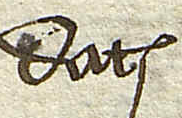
Dat*
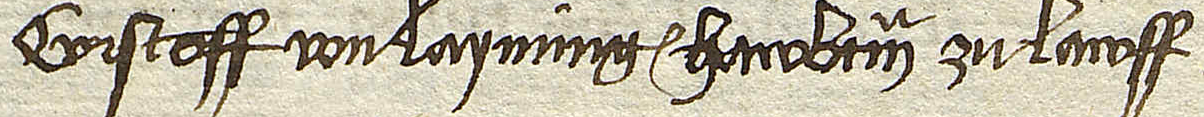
Criſtoff von Layning* hawbtm* ʒu Lawff
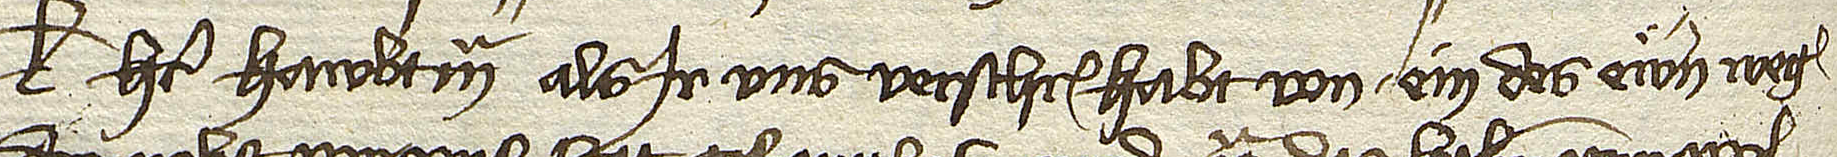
L* hr* hawbtm* als Ir vns verſchr* habt von / ein des eẅn* weg*
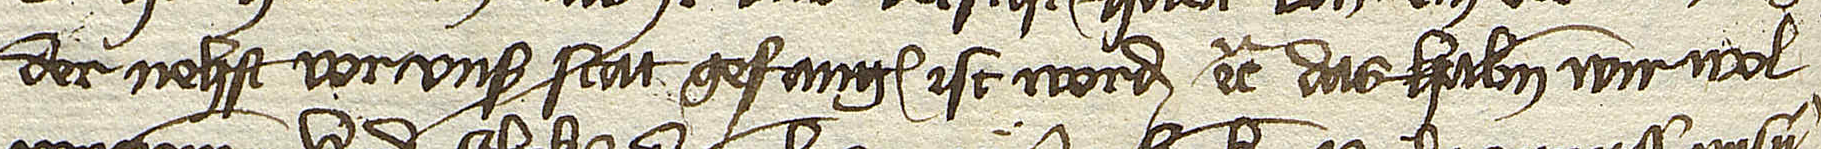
der nehſt vor vnſ* ſtat gefang* iſt word* ec* das habn* wir wol
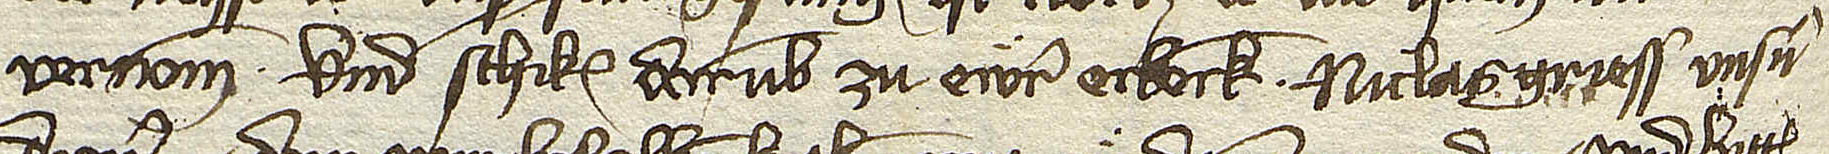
vernom* vnd ſchik* darub* ʒu eẅr* erberk* . Niclas grieſſ vnſn*
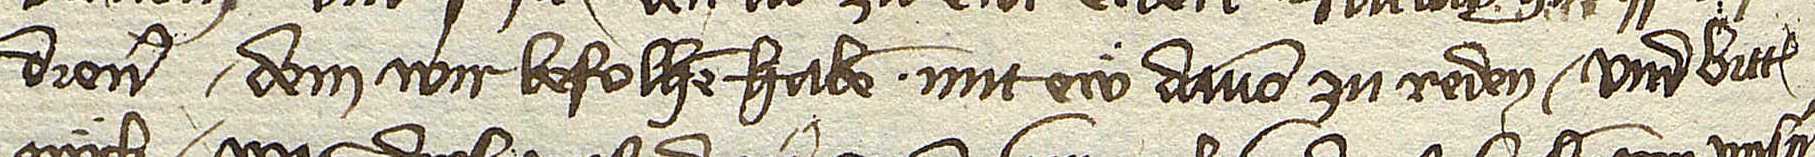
dien* / dem wir befolhe* habe* . mit ew* dauo* ʒu reden / vnd bitt*
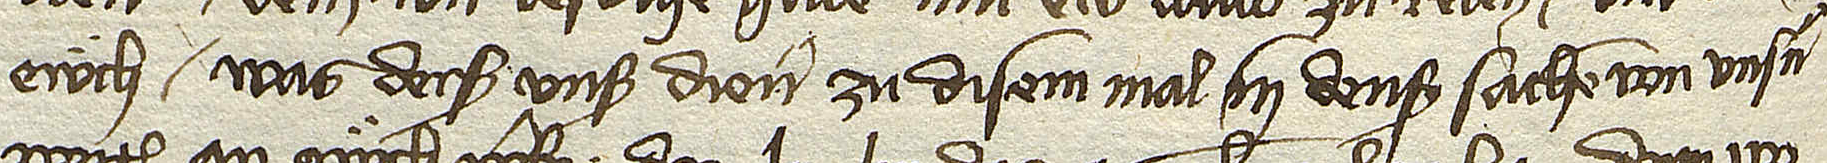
eẅch / was derſ* vnſ* dien* ʒu diſem mal in* denſ* ſache* von vnſn*
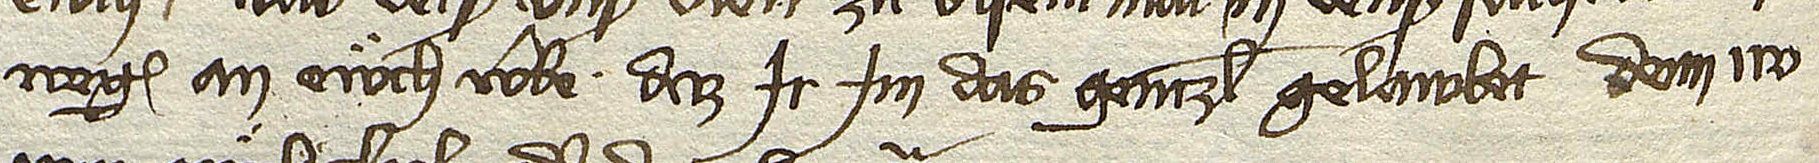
weg* an eẅch w*be daʒ Ir Im das gencʒl* gelawbet denn wo
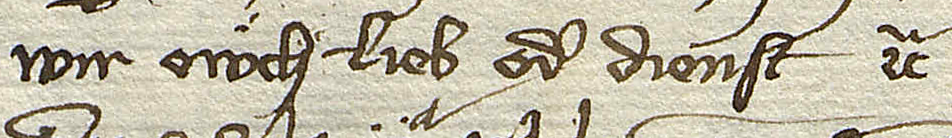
wir eẅch lieb od* dienſt ec*
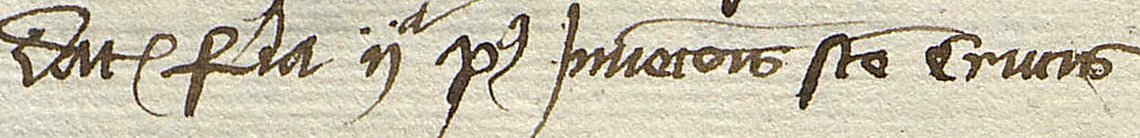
Dat* fia ii* p* Inuecois* ſce* Crucis
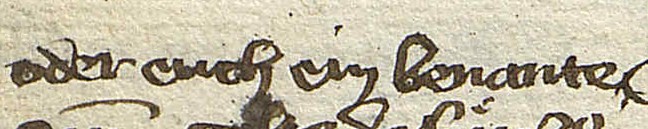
oder ewch ein benante
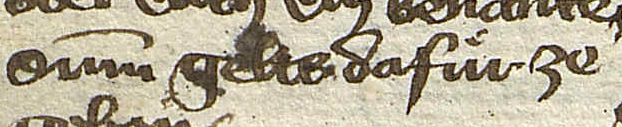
Sum* gelts dafür cʒe
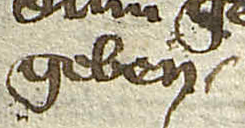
geben /
